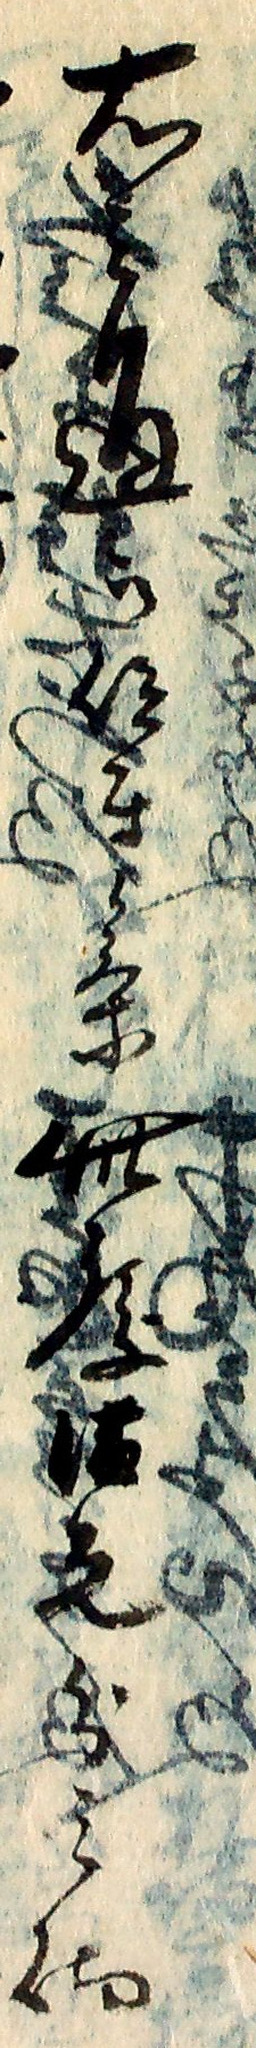右之通被仰付候条此度御見分之砌
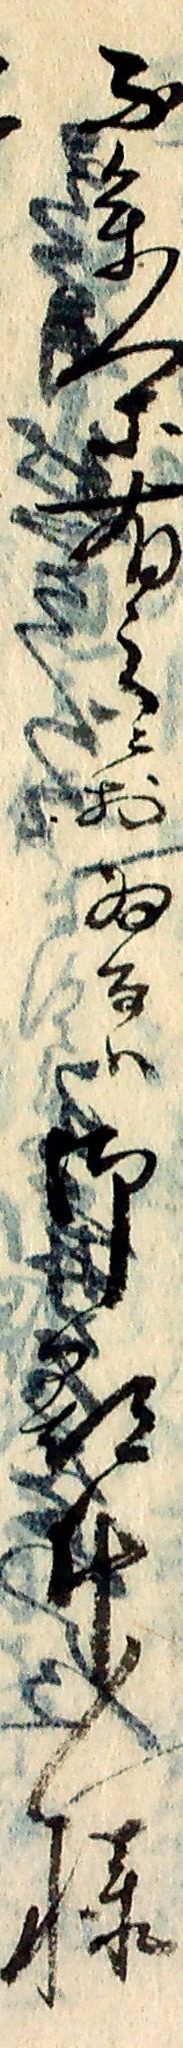不参人等有之におゐては御郡代様
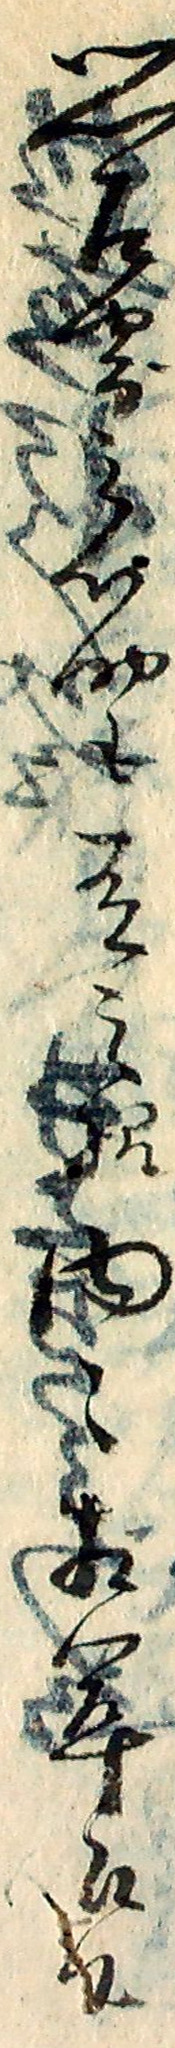思召寄之筋も有之様内々相聞え候
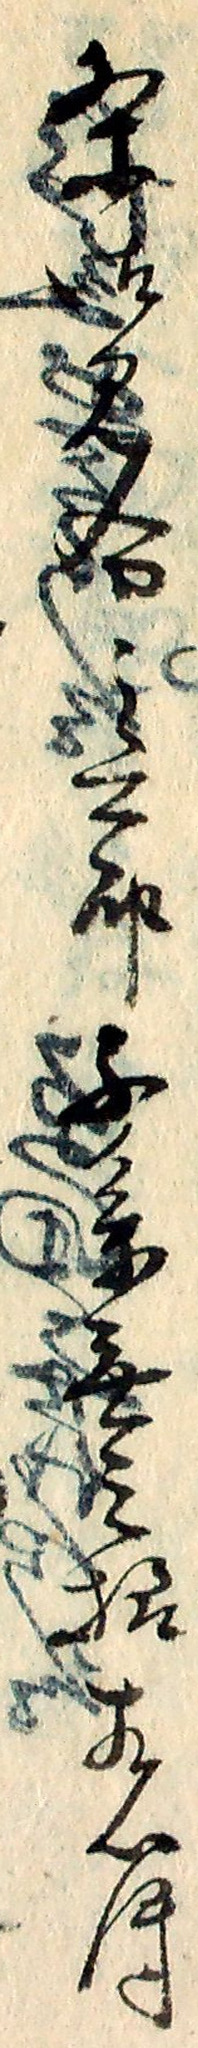条御見分之節不参無之様相心得
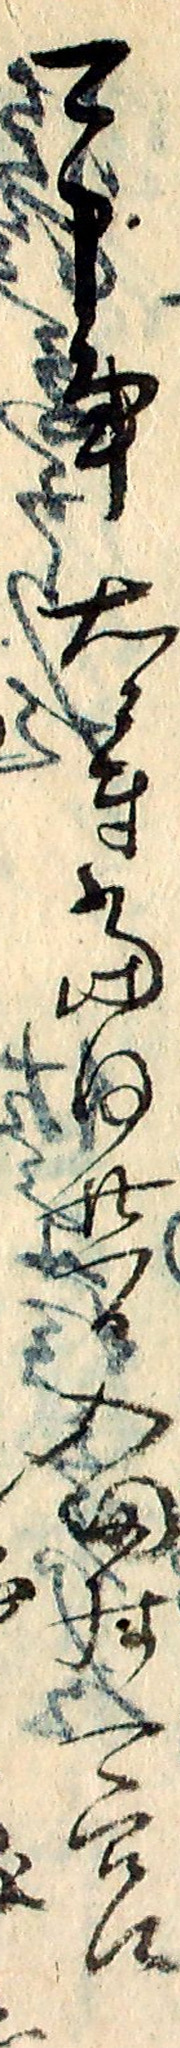可申事右に付当月廿一日入田村一宮
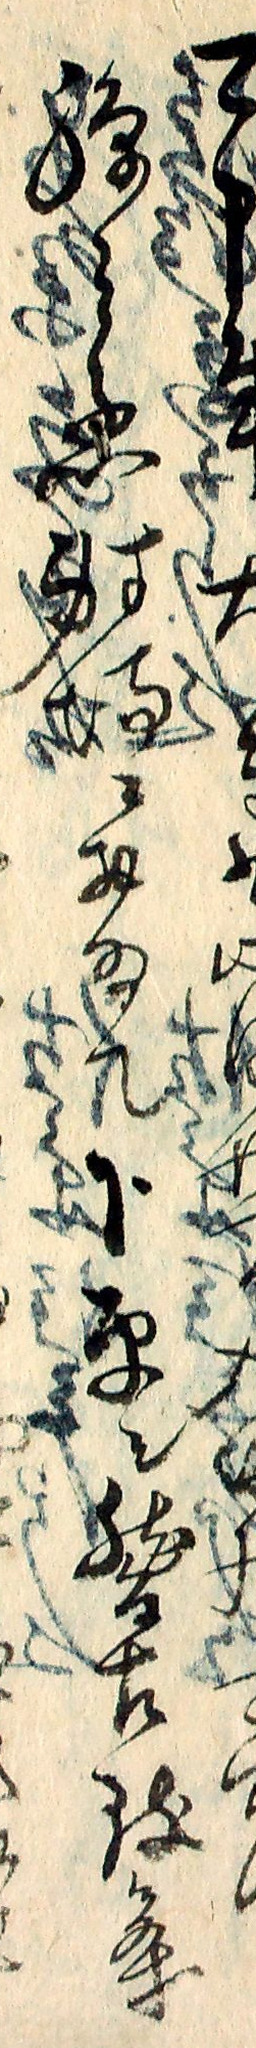孫之丞射場におゐて下平し稽古致候条
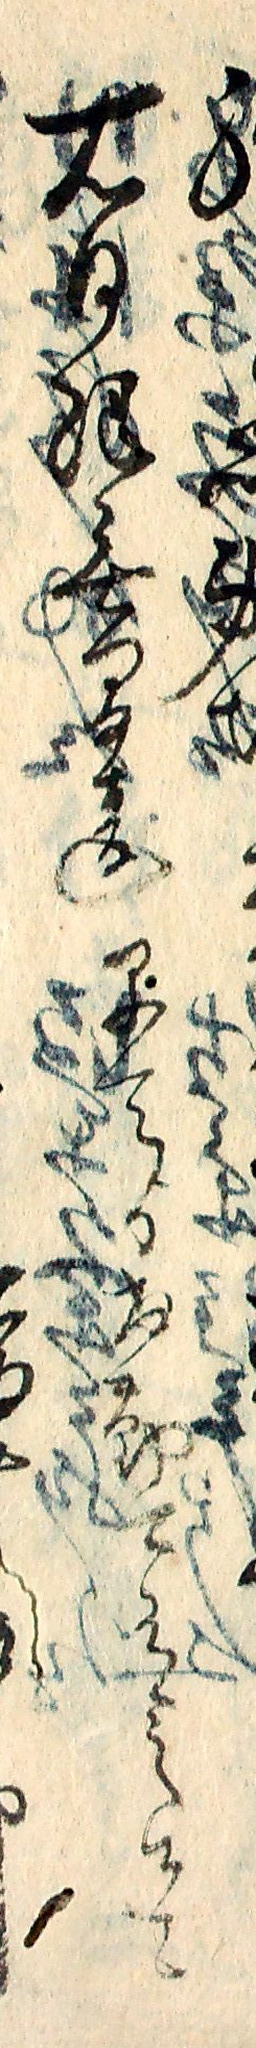右日限無間違早天ゟ出勤可有之候以上
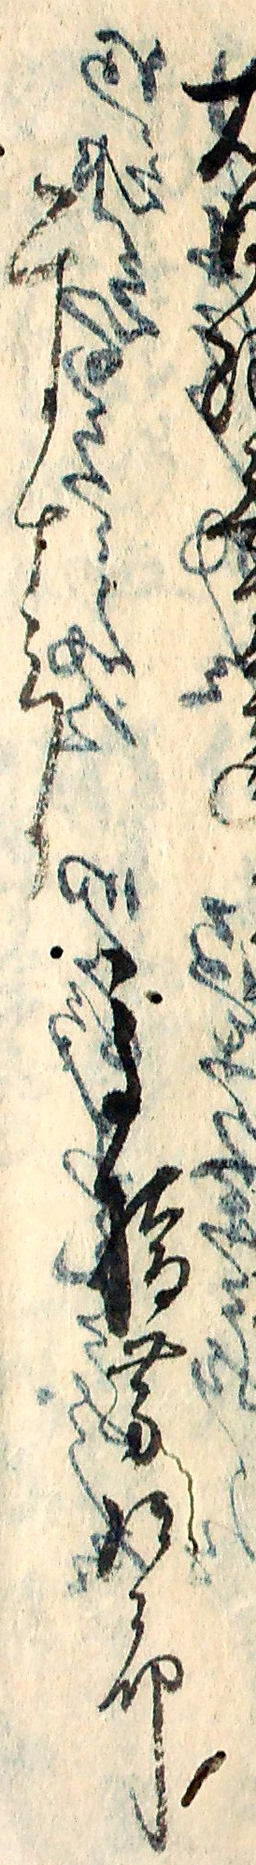二月十三日

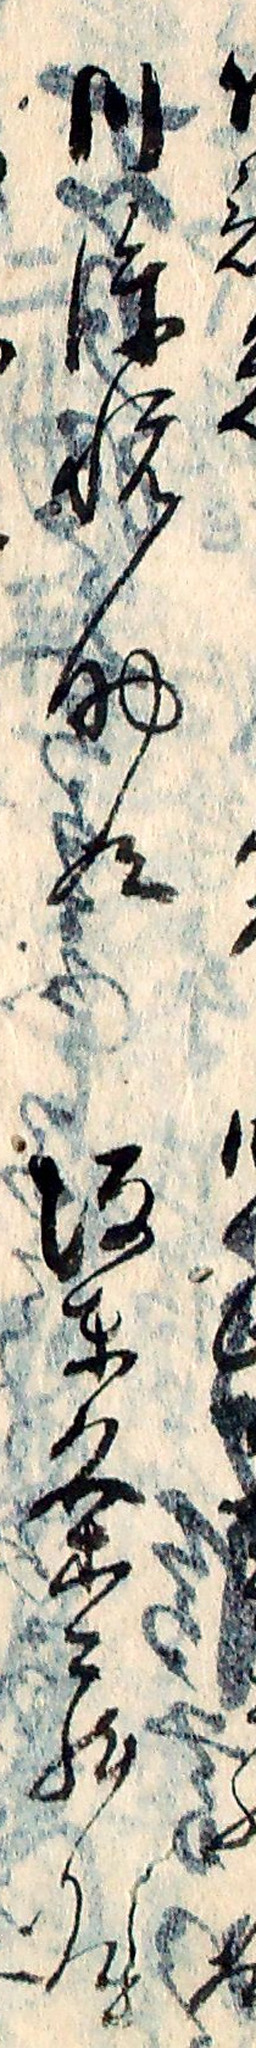川添悦助殿坂東粂蔵殿
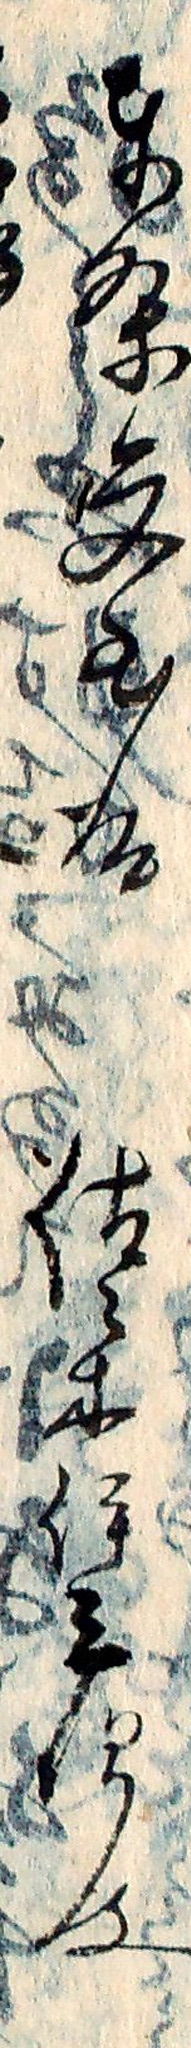東条文蔵殿佐々木伊三次殿
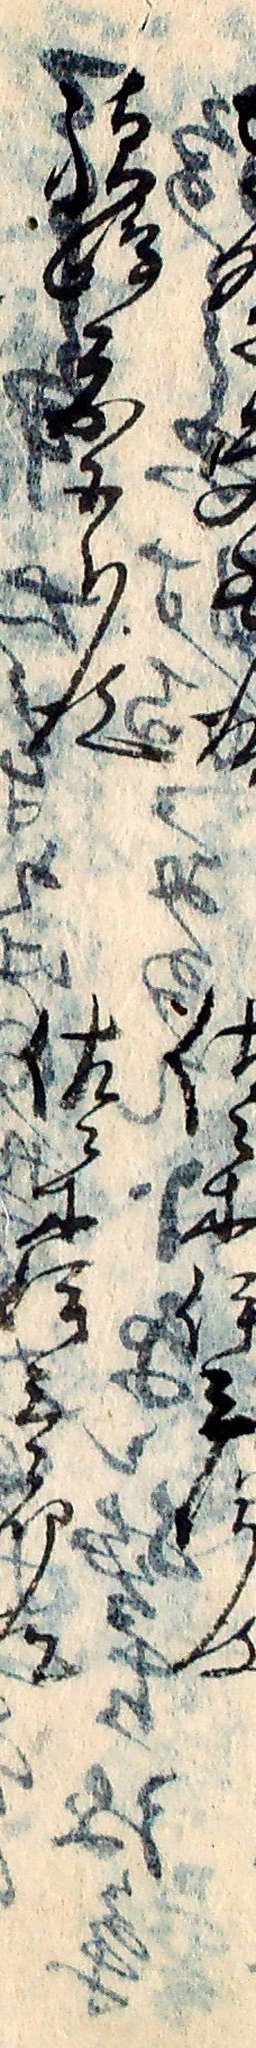禎島嘉五郎殿佐々木伊三郎殿
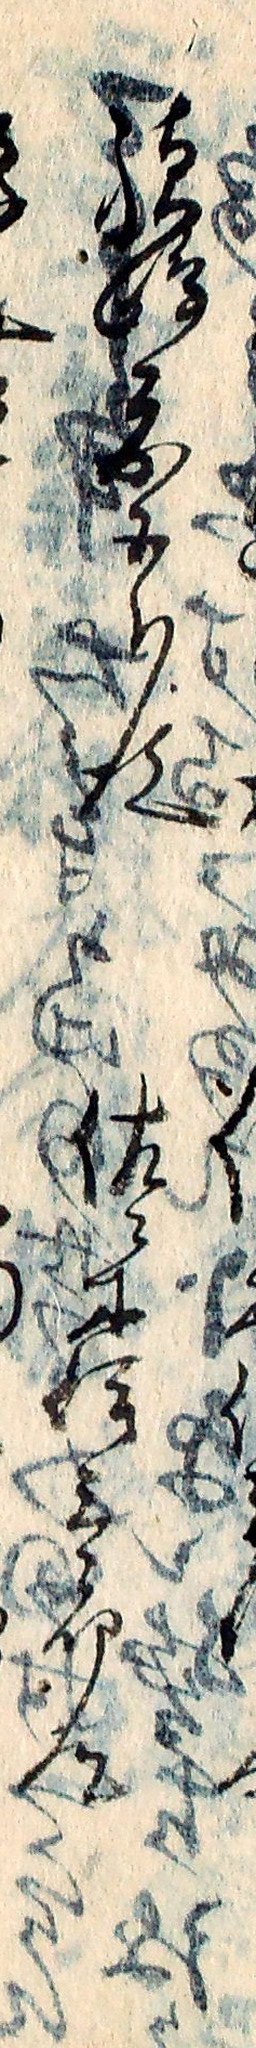禎島嘉五郎殿佐々木伊三郎殿
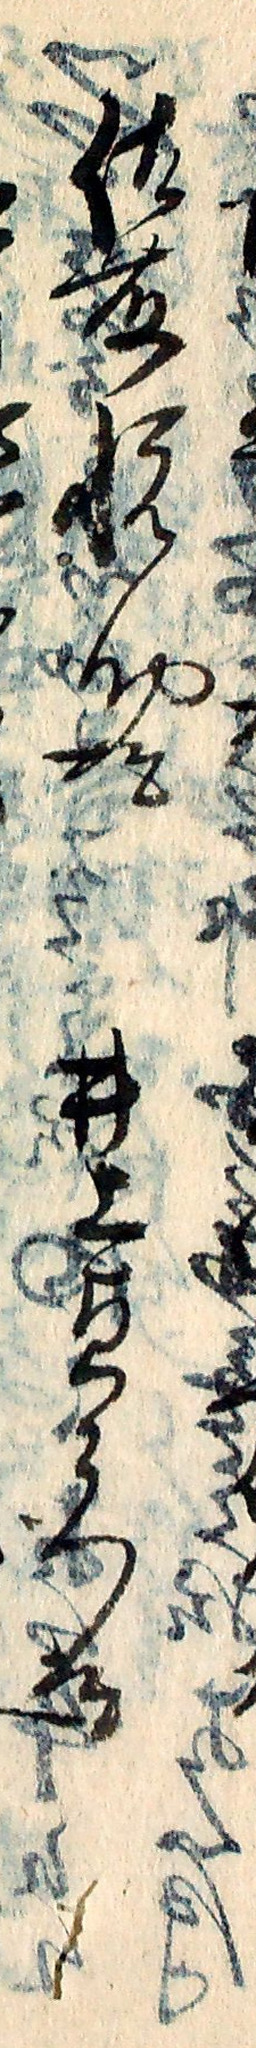佐藤悦助殿井上貞右衛門殿
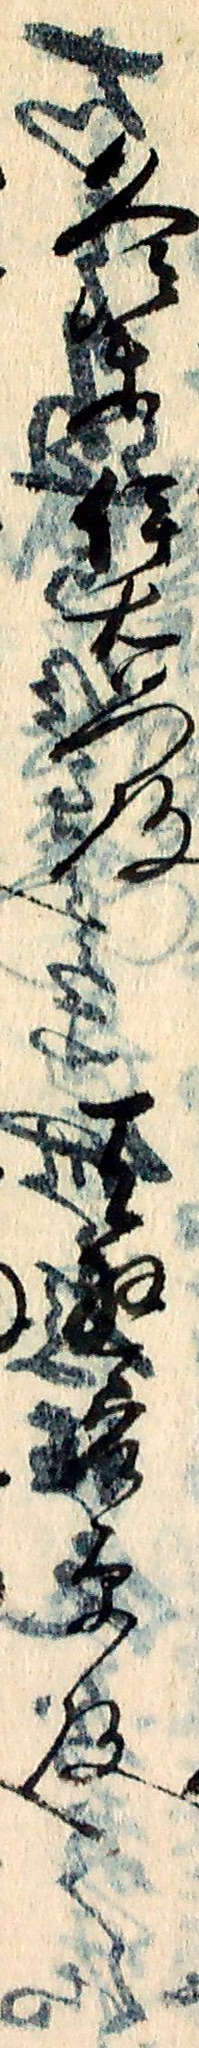久須米伊右衛門殿天羽兵衛殿
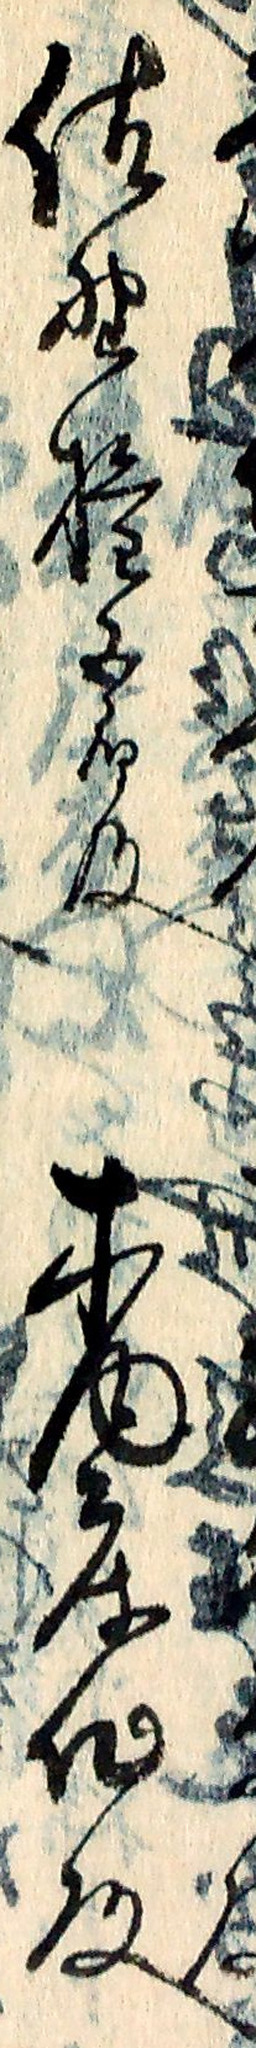佐野権五郎殿木内床作殿

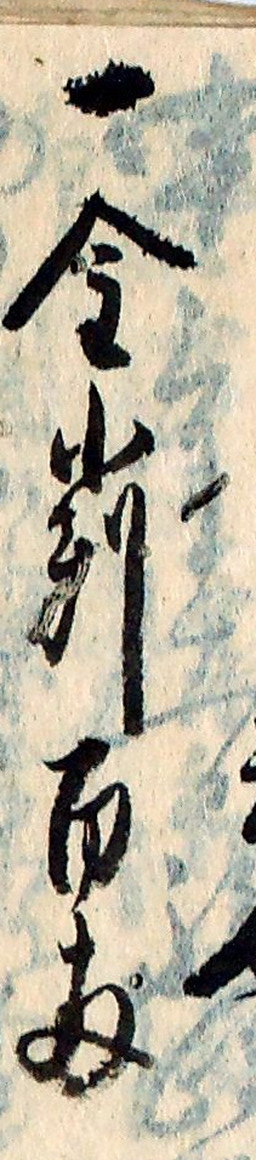一金小判百両
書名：諸御願書控(後藤氏壱番）
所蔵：鳴門教育大学 Naruto University of Education
